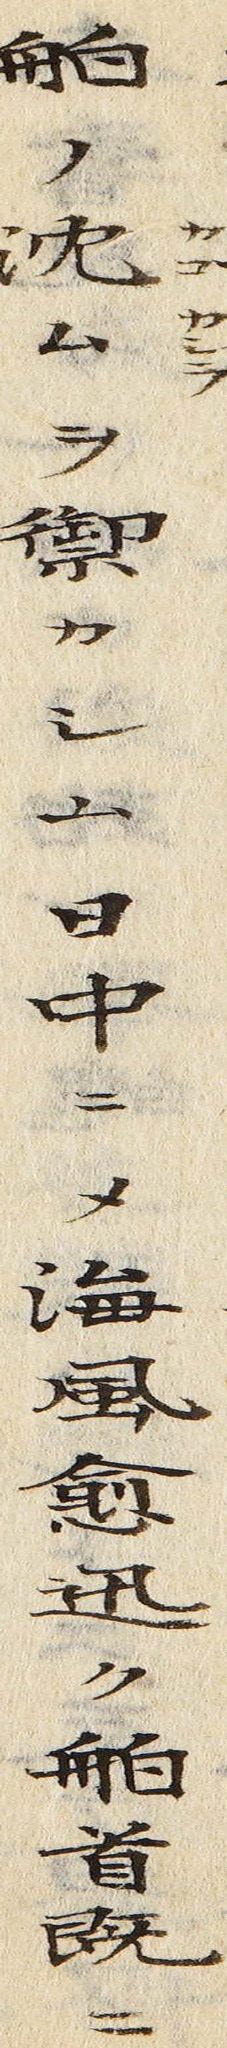舶ノ沈ムヲ禦カシム日中ニシテ海風愈迅ク舶首既ニ
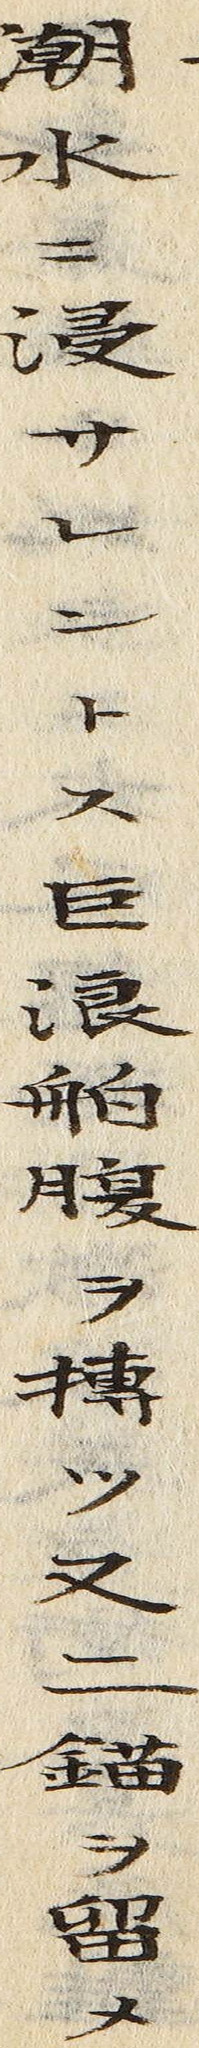潮水ニ浸サレントス巨浪舶腹ヲ搏ツ又二錨ヲ留メ
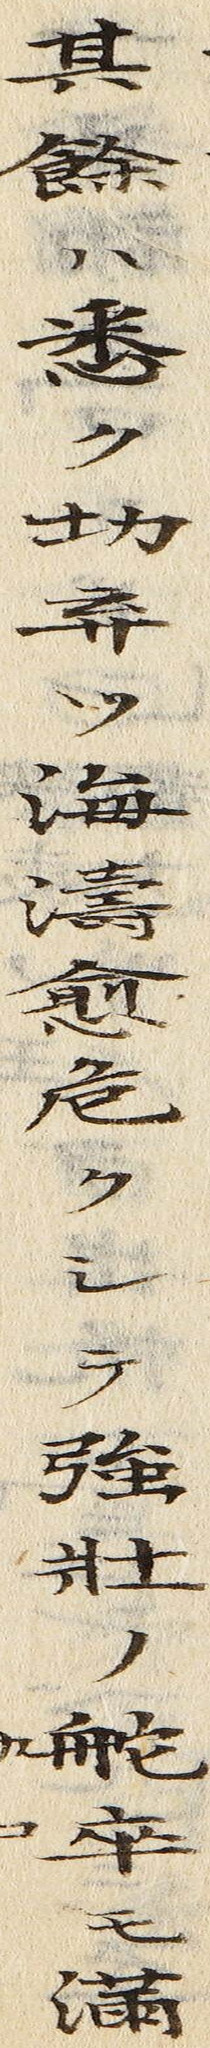其余ハ悉ク功棄ツ海濤愈危クシテ強壮ノ舵卒モ満
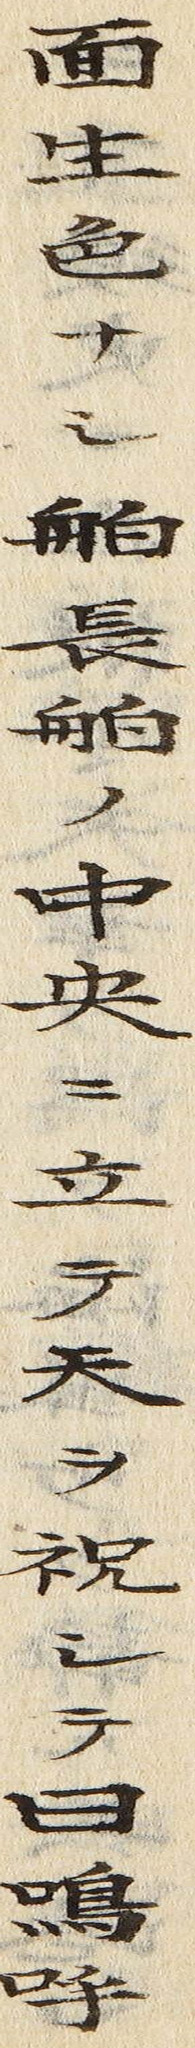面生色ナシ舶長舶ノ中央ニ立テ天ヲ祝シテ曰嗚呼
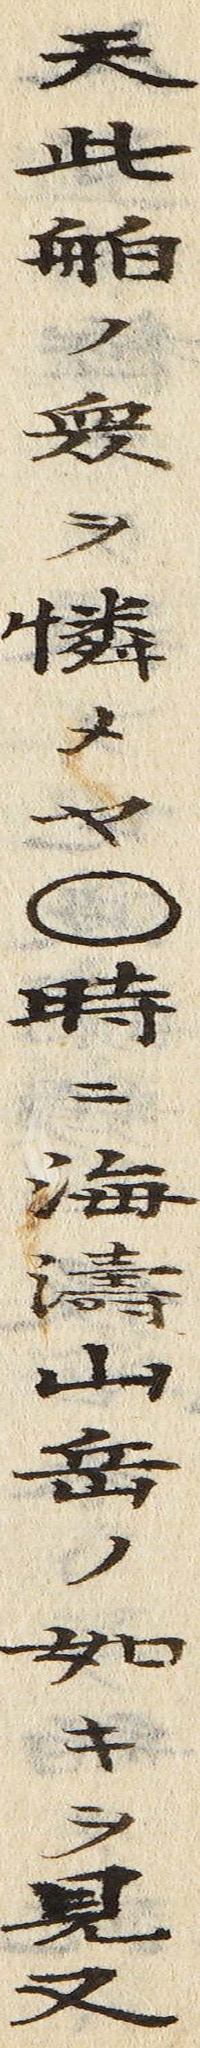天此舶ノ衆ヲ憐メヤ○時ニ海濤山岳ノ如キヲ見又
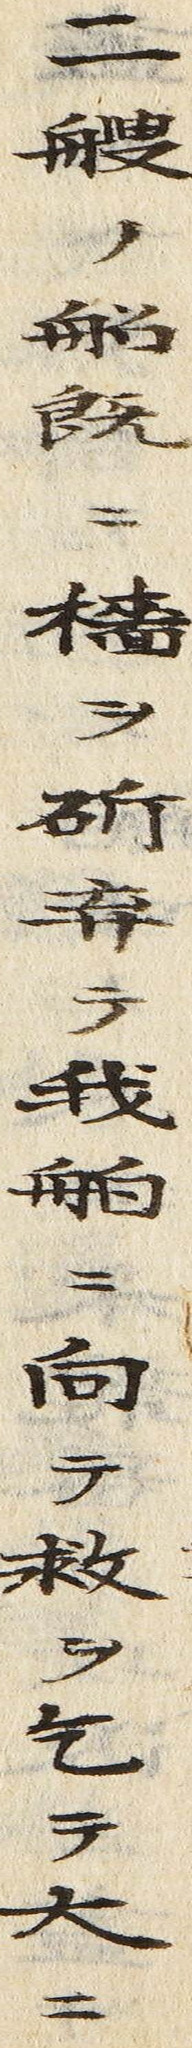二艘ノ船既ニ檣ヲ斫棄テ我舶ニ向テ救ヲ乞テ大ニ
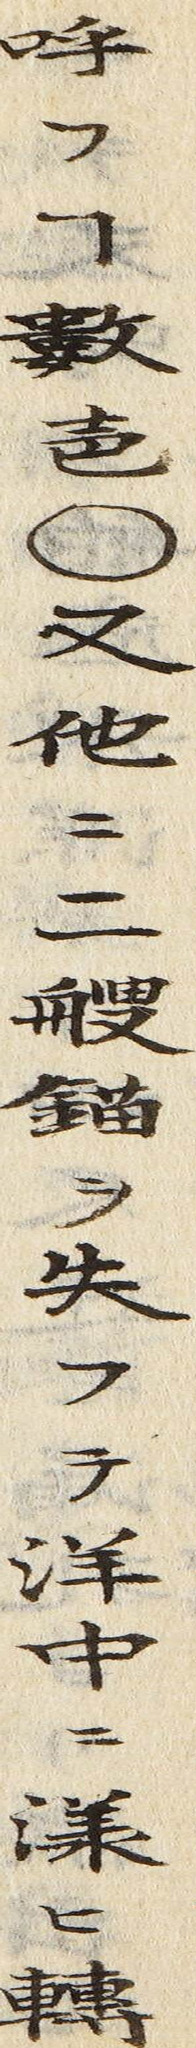呼フコト数声○又他ニ二艘錨ヲ失フテ洋中ニ漾ヒ転
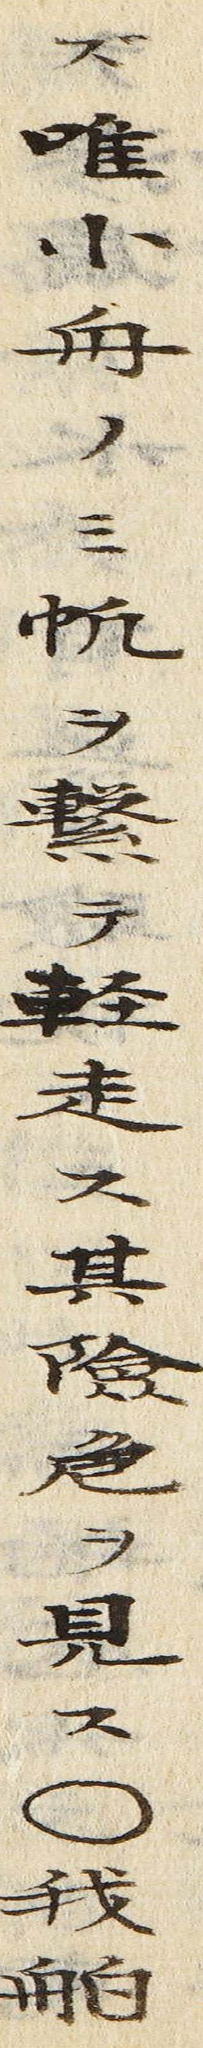ズ唯小舟ノミ帆ヲ繋テ軽走ス其険危ヲ見ス○我舶
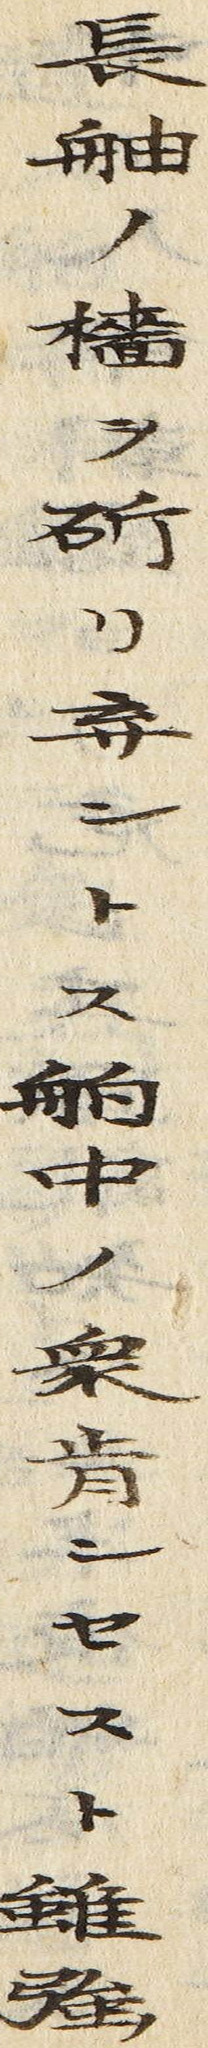長舳ノ檣ヲ斫リ棄ントス舶中ノ衆肯ンセスト雖強
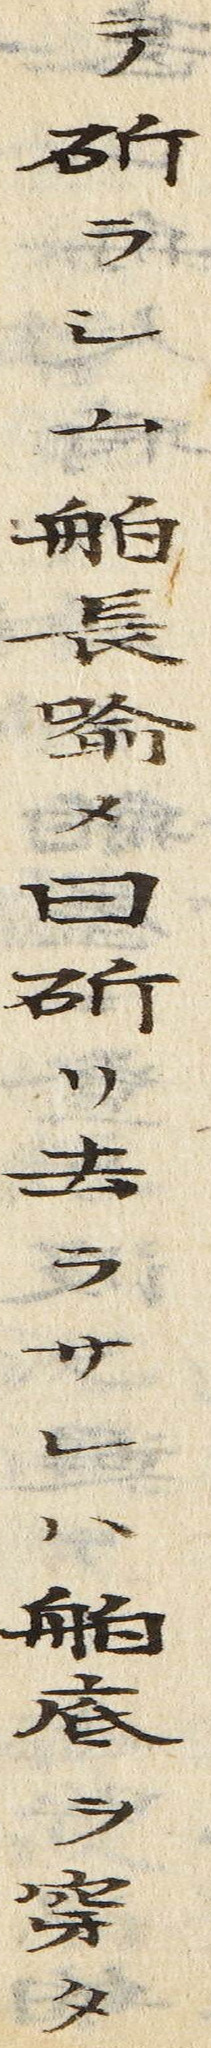テ斫ラシム舶長喩𬼀曰斫リ去ラサレハ舶底ヲ穿タ
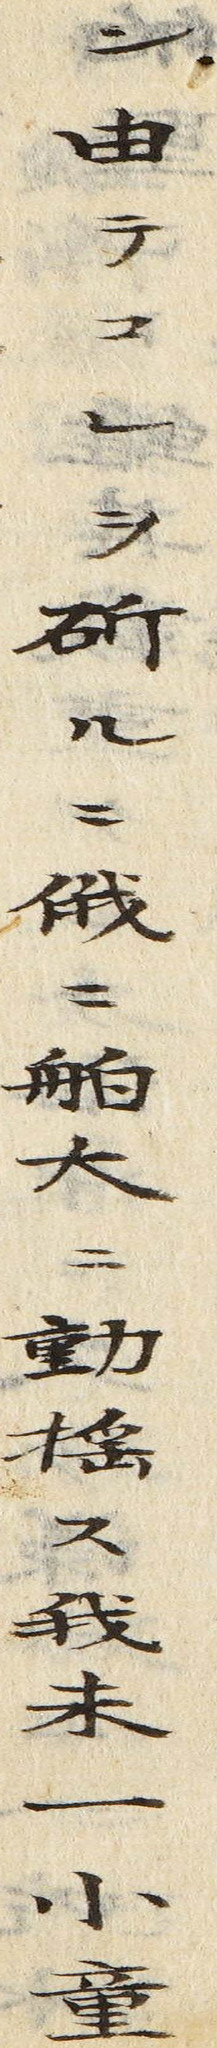ン由テコレヲ斫ルニ俄ニ舶大ニ動揺ス我未一小童
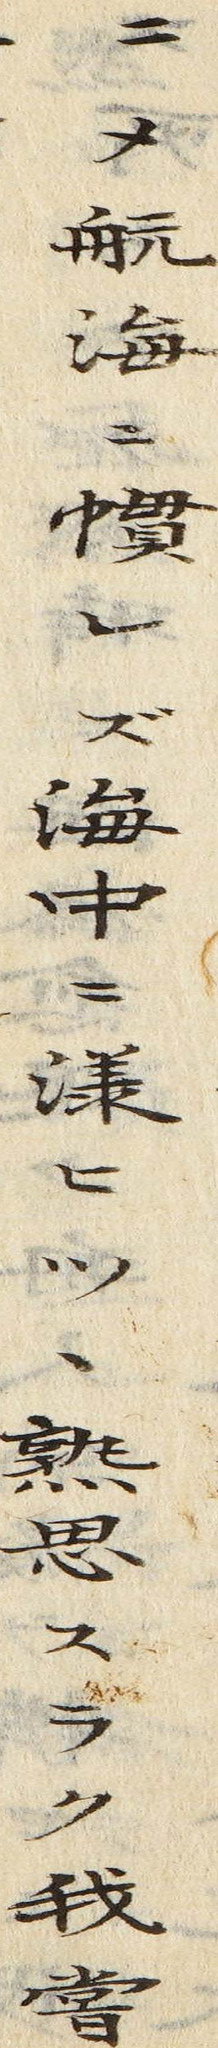ニ𬼀航海ニ慣レズ海中ニ漾ヒツヽ熟思スラク我嘗
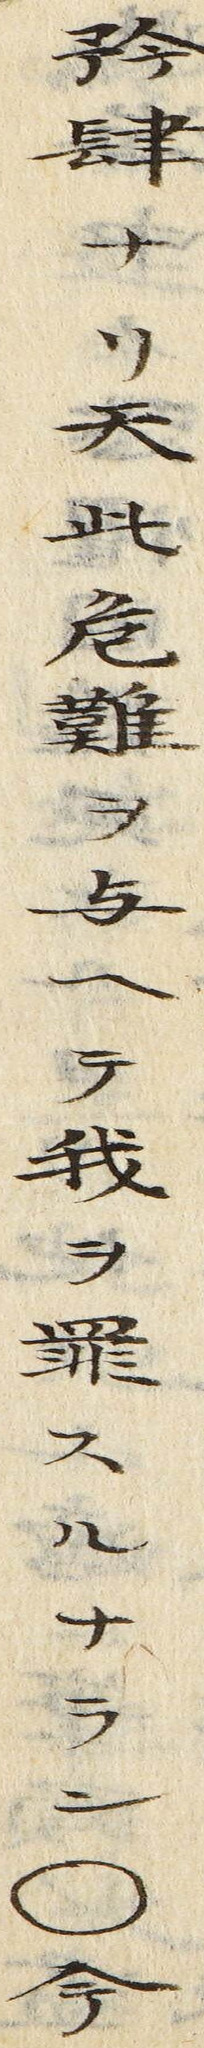矜肆ナリ天此危難ヲ与ヘテ我ヲ罪スルナラン○今

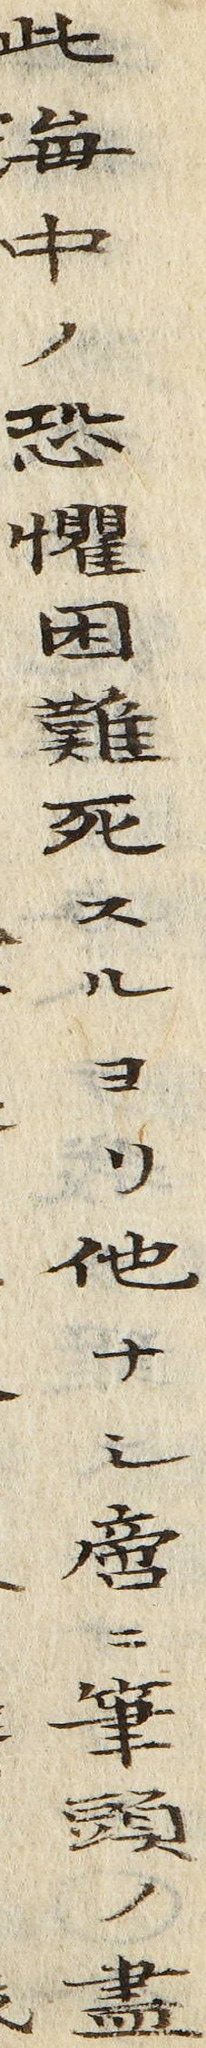此海中ノ恐懼困難死スルヨリ他ナシ啻ニ筆頭ノ尽
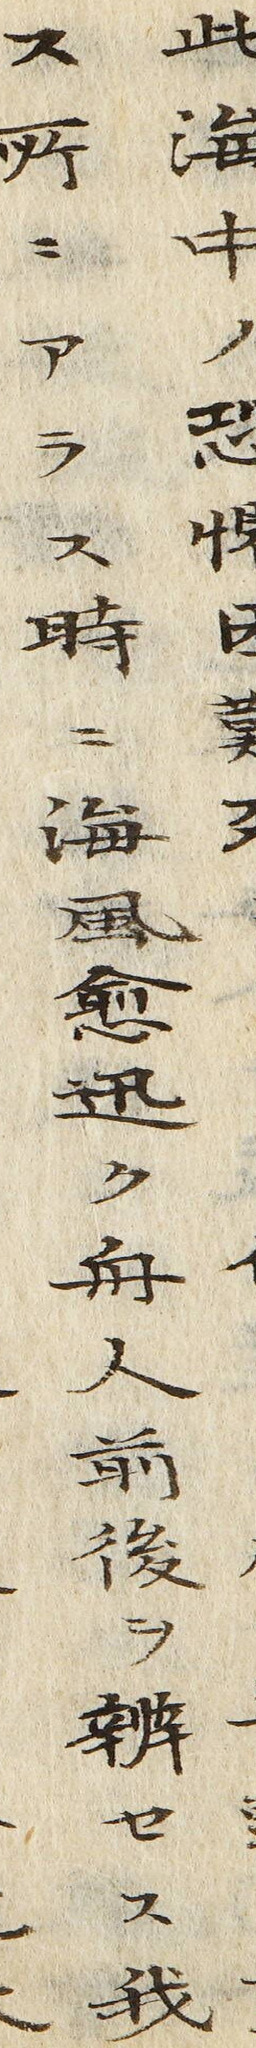ス所ニアラス時ニ海風愈迅ク舟人前後ヲ弁セス我
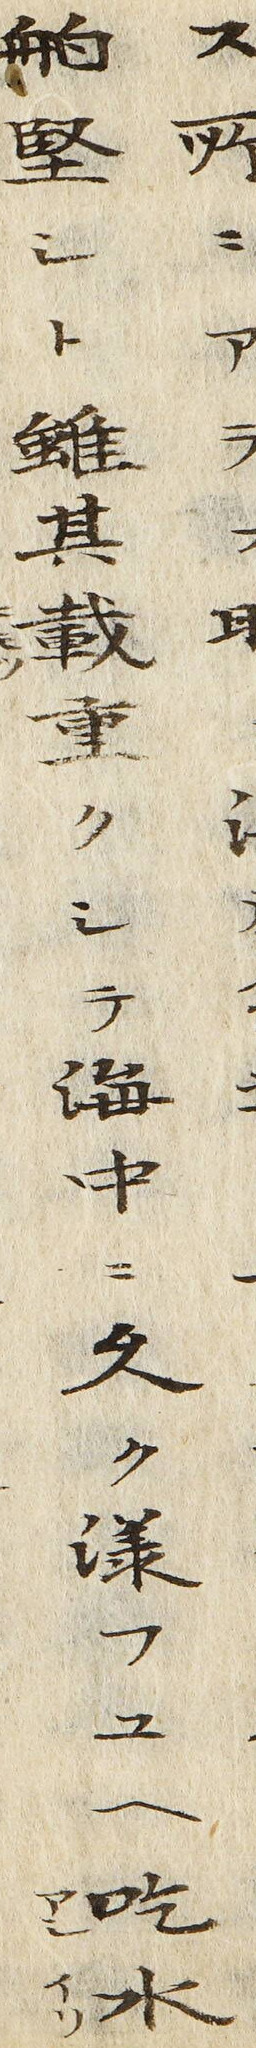舶堅シト雖其載重クシテ海中ニ久ク漾フユヘ吃水
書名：漂流紀事
